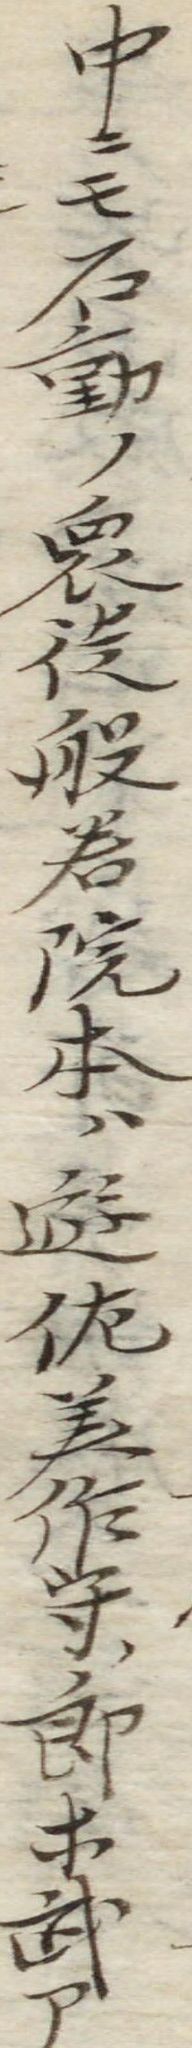中ニモ石動ノ衆徒般若院本ハ遊佐美作守郎等武申
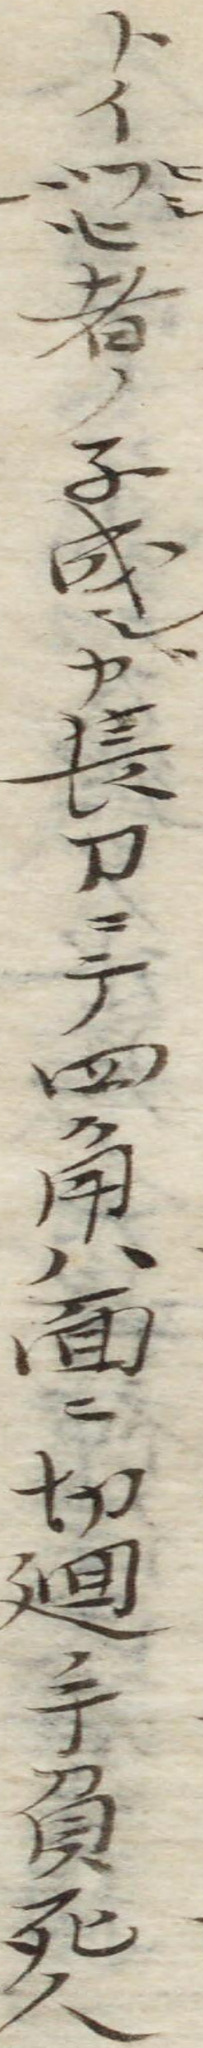トイ者ノ子成シガ長刀二テ四角ハ面ニ切廻手負死人
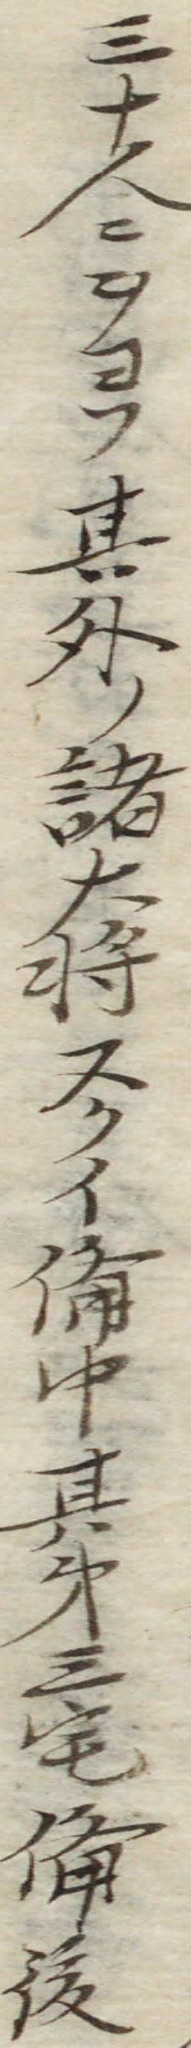三十人ニヲヨフ其外ノ諸大将スクイ備中其弟三宅備後
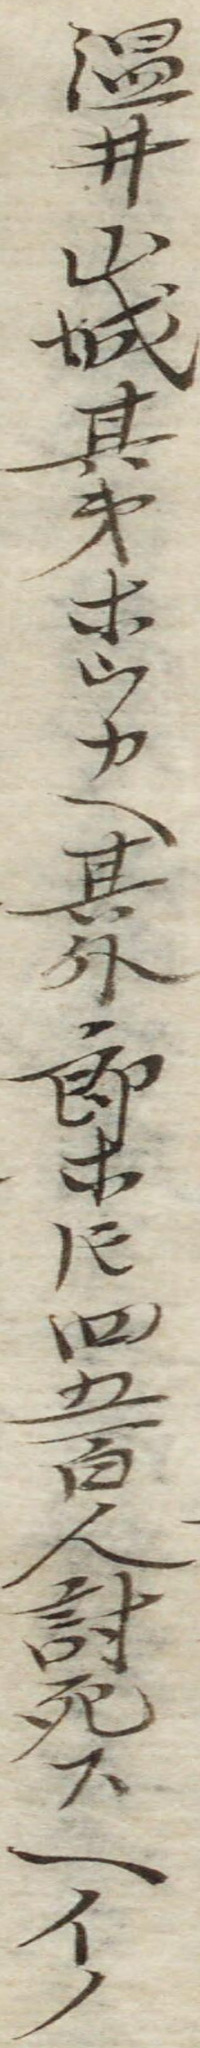温井山城其弟等ツカヘ其外郎等トモ四五百人討死スヘイノ
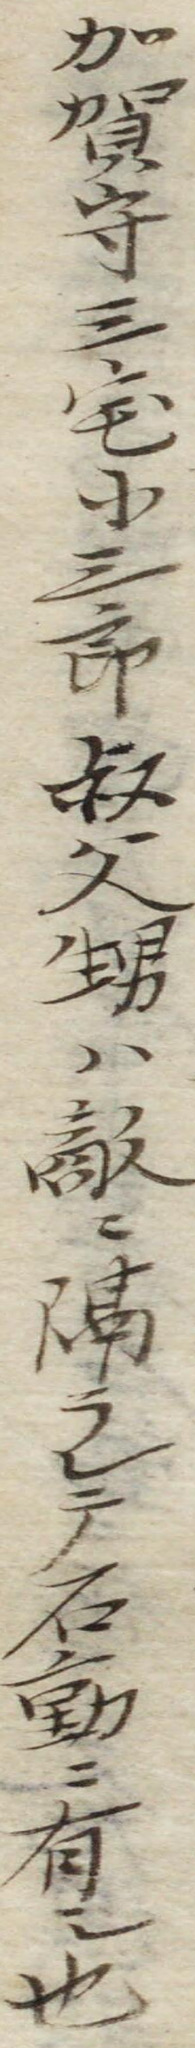加賀守三宅小三郎叔父甥ハ敵ニ隔ラレテ石動ニ有シ也

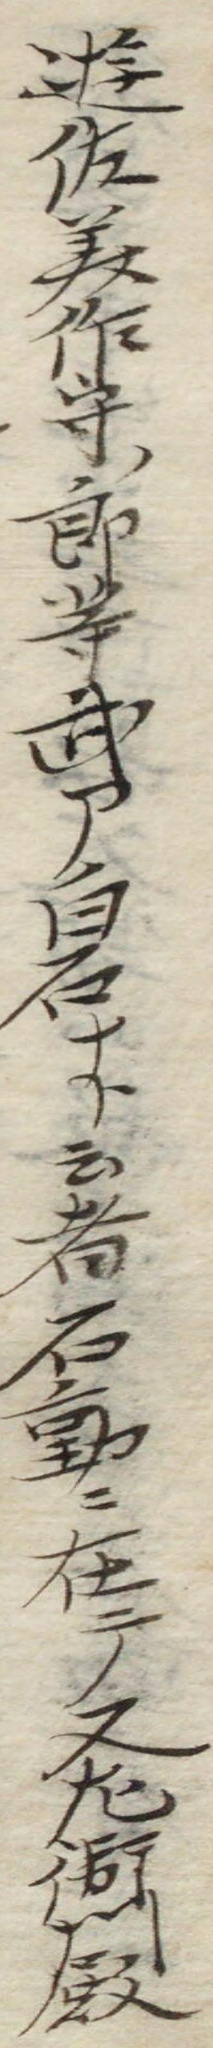遊佐美作守ノ郎等武甲白石ナト云者石動ニ在テ又左衛門殿
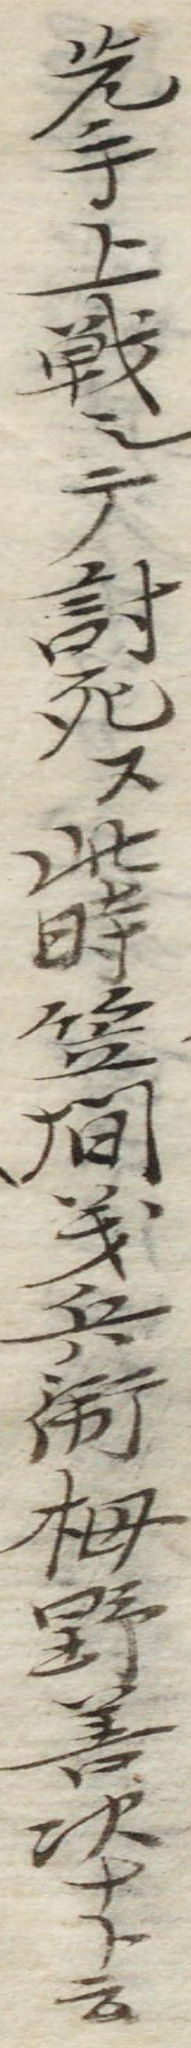先手上戦シテ討死ス此時笠間義兵衛栂野善治ナト云
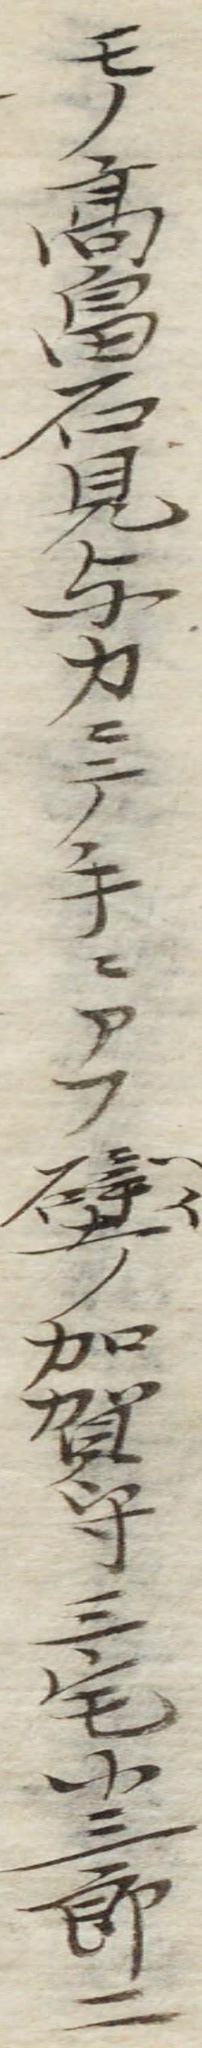モノ高畠石見与力二テ手ニアフ璧ノ加賀守三宅小三郎二
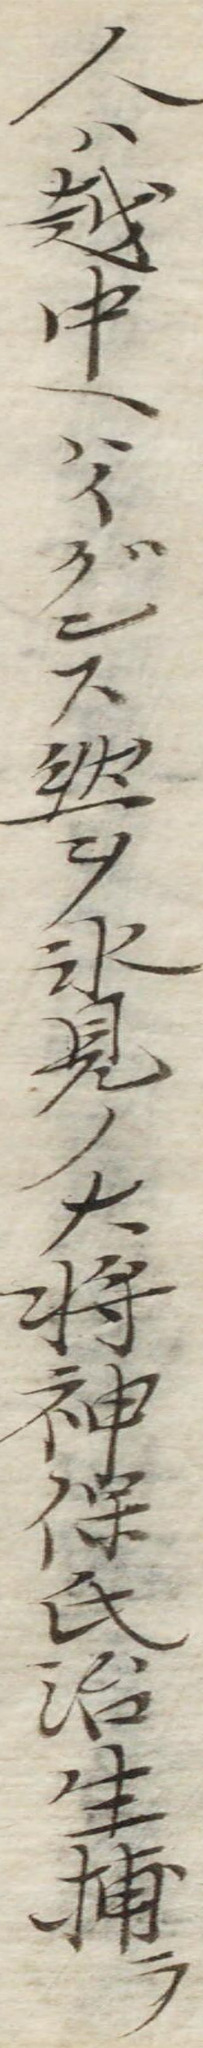人ハ越中ヘハイグンス然ヲ氷見ノ大将神保氏治生捕ラ
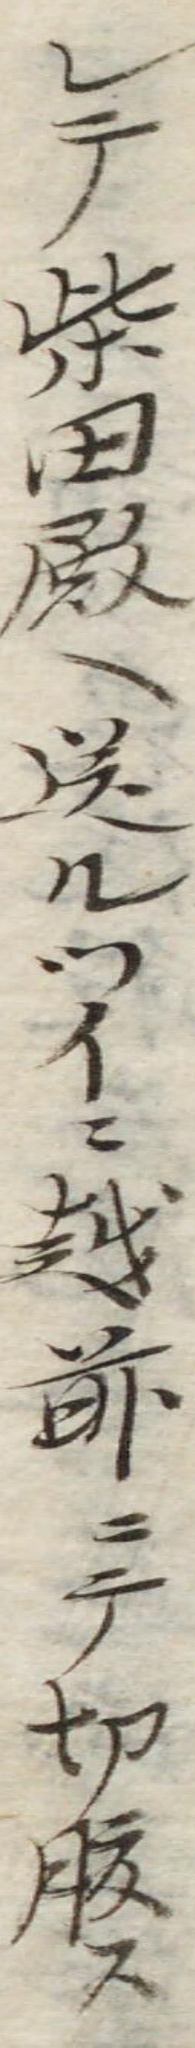レテ柴田殿へ送ルツイニ越前二テ切腹ス
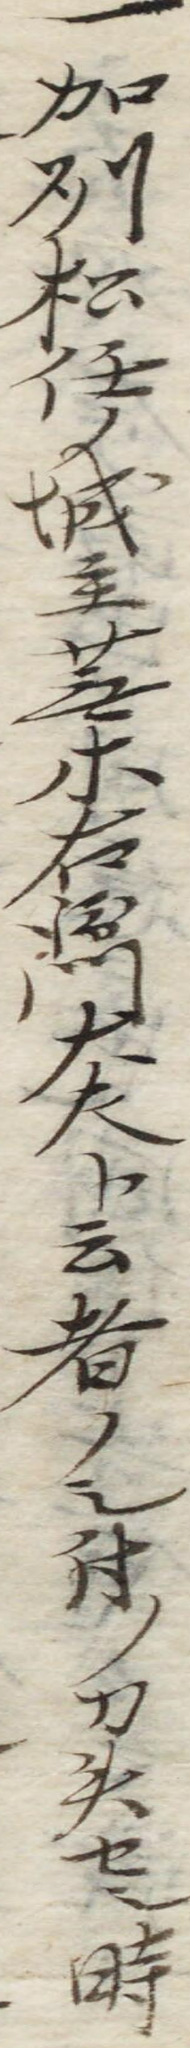一加州松任ノ城主荒木右衛門大夫ト云者ノシ付ノ刀失セシ時
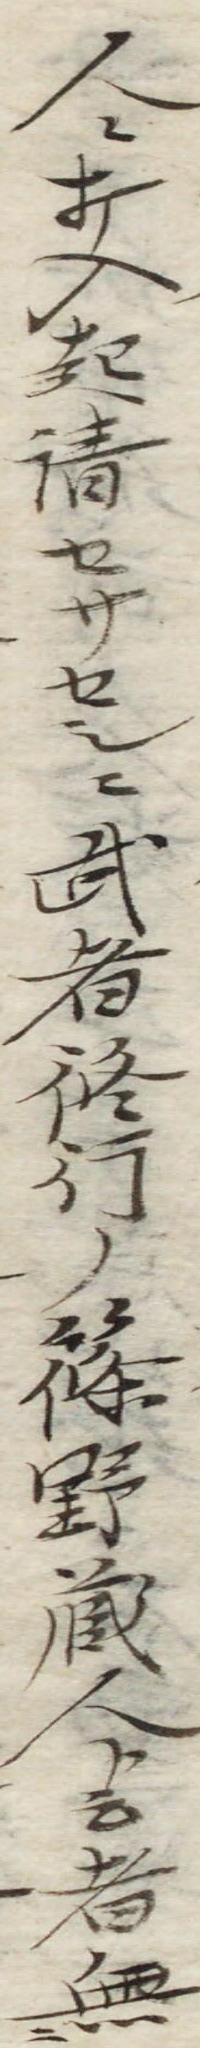人ニ打入起清セサセシニ武者修行ノ篠野藏人ト云者無
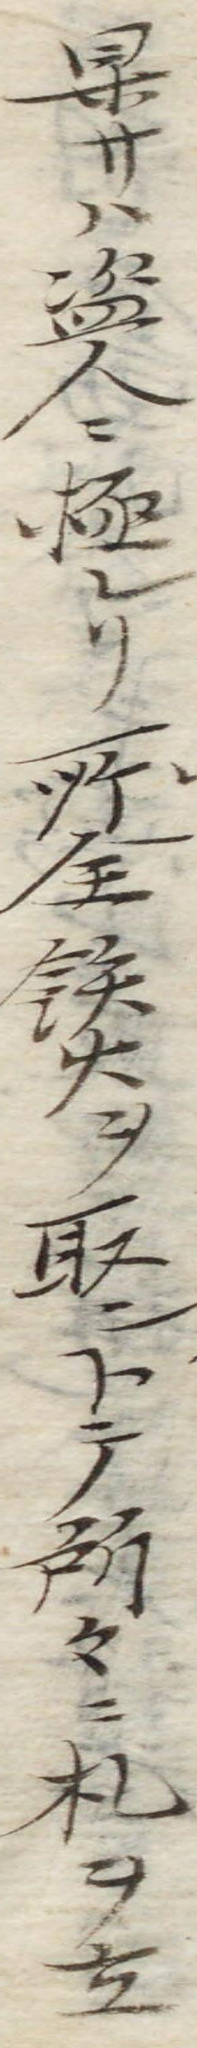果サハ盗人ニ極レリ所全鉄火ヲ取ントテ所々ニ札ヲ立
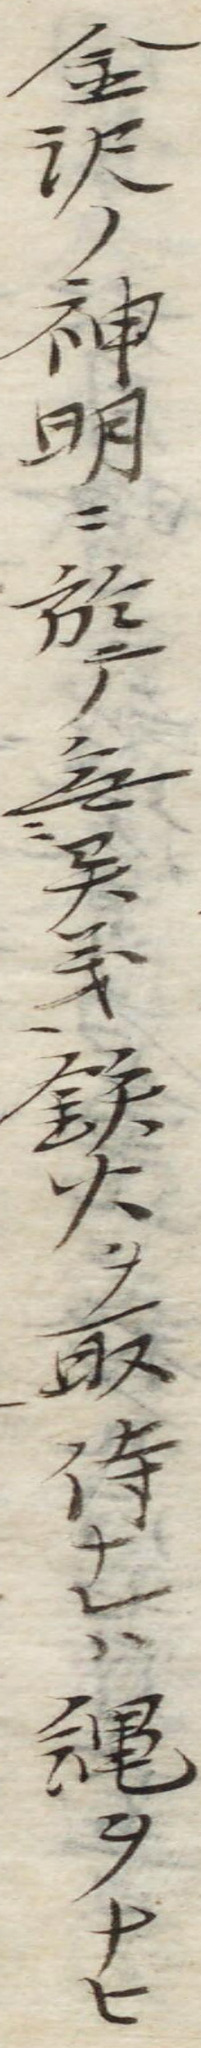金沢ノ神明ニ於テ無灵義鉄火ヲ取侍ナレハ縄ヲナヒ
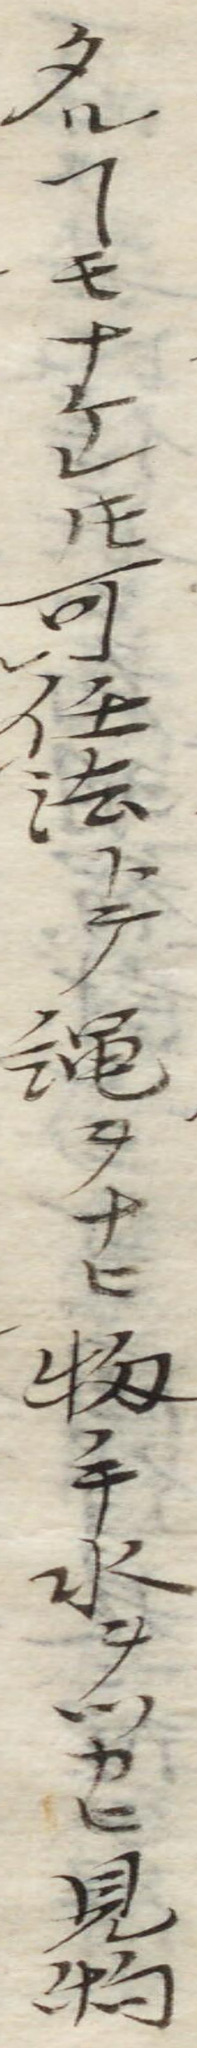タル事モナケレトモ可任法トテ縄ヲナヒ扨手水ヲツカヒ見物
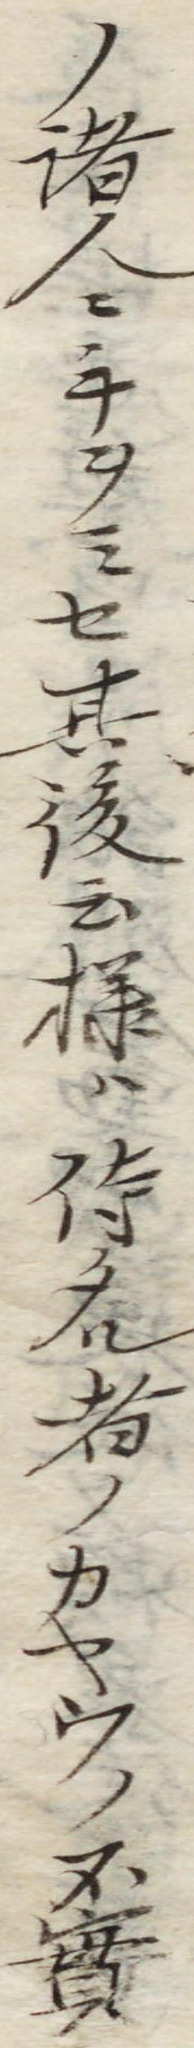ノ諸人ニ手ヲミセ其後云様ハ侍タル者ノカヤウノ不実
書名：聞見雑録
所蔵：Ishikawa Prefectural Library
